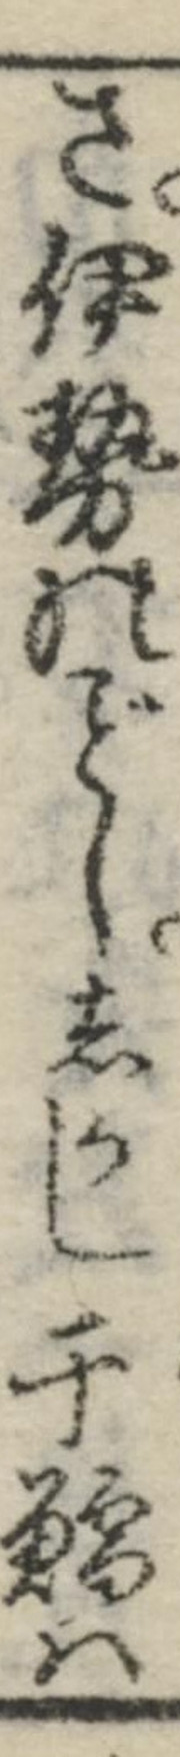き。伊勢のごとし。しかし干鱈は
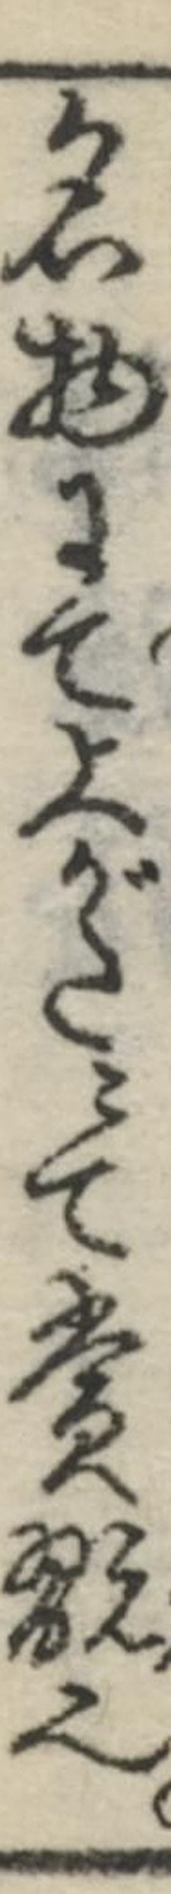名物にて。上がたにて賞翫也。
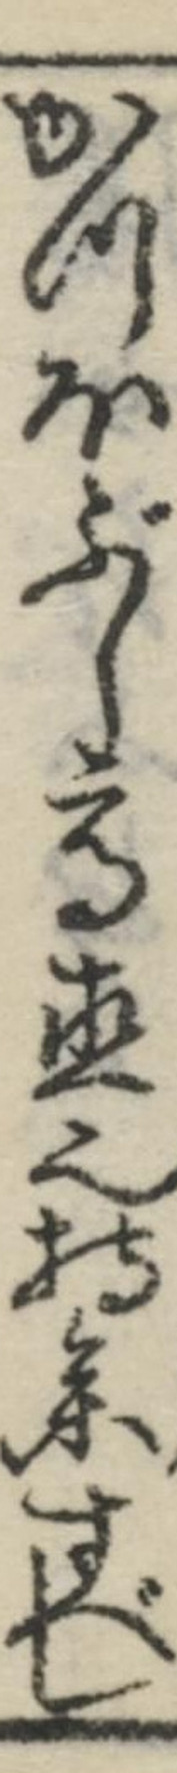かつほぶし高直也。持参すべし。
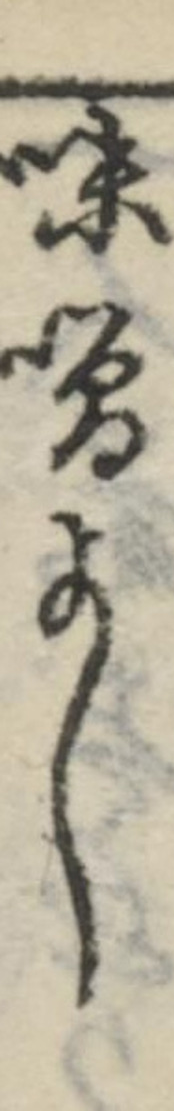味噌よし
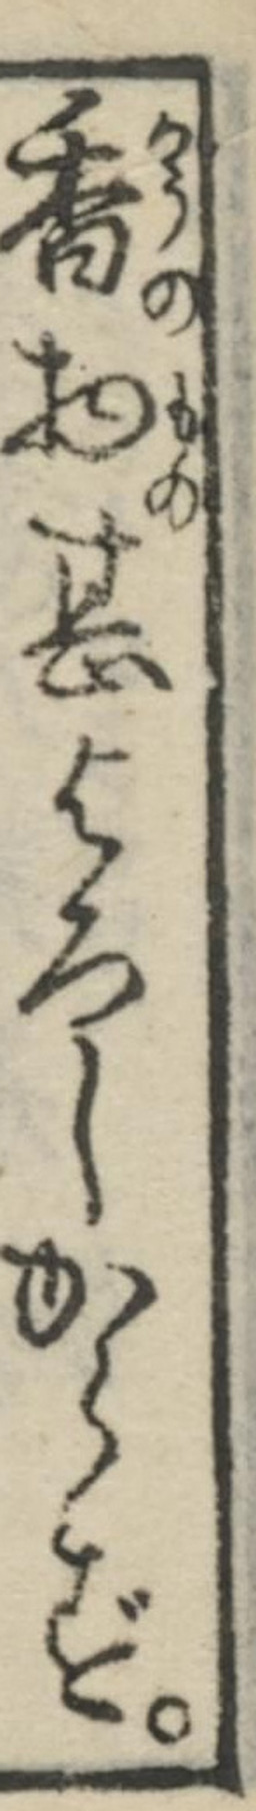香物甚よろしからず。
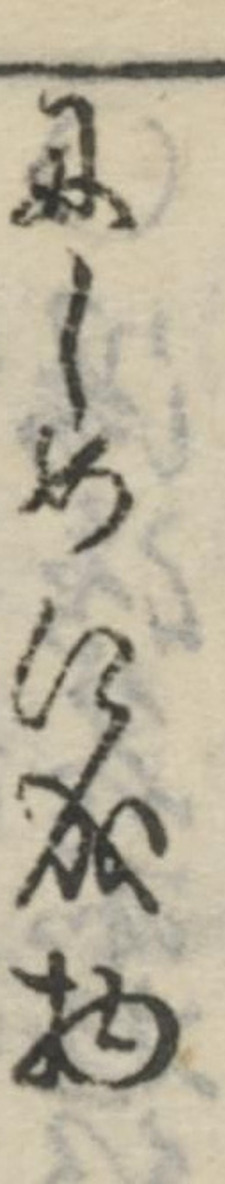にしめに成物
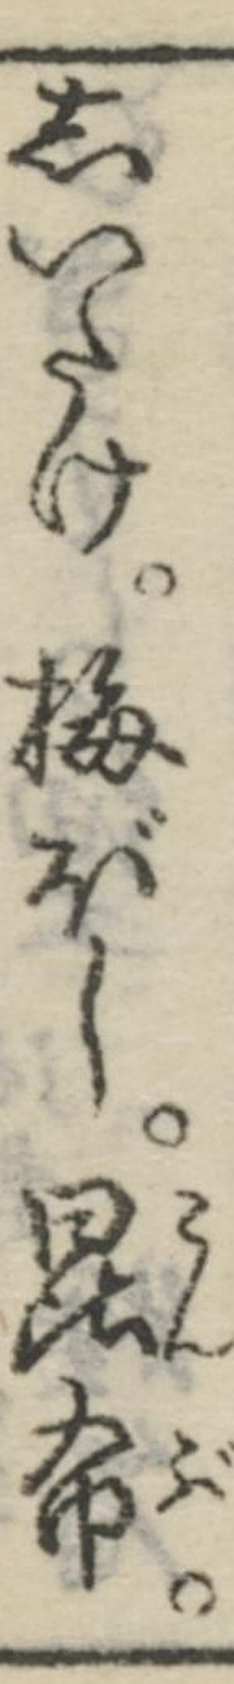しいたけ。梅ぼし。昆布。
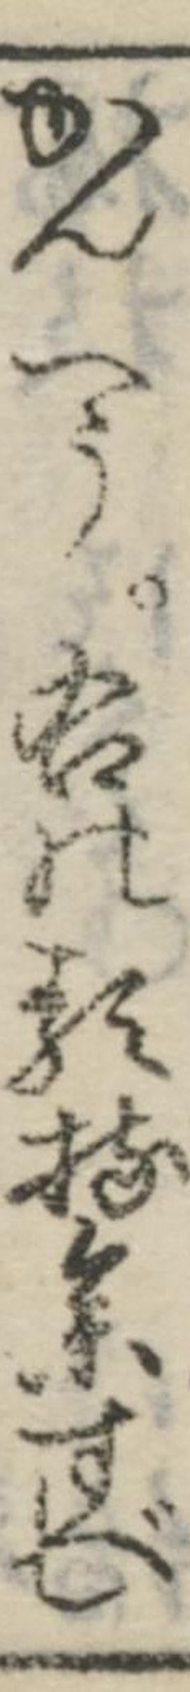かんへう。右の類持参すべし。
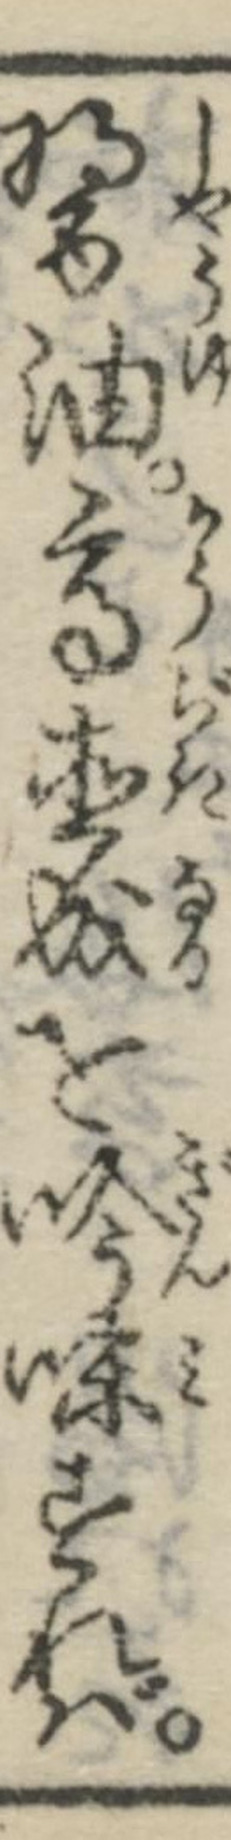醤油。高直成を吟味すれば
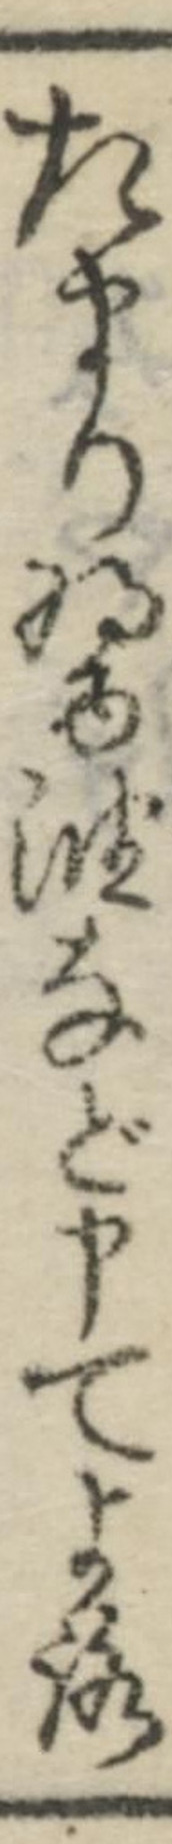たまり醤油など申てよろ
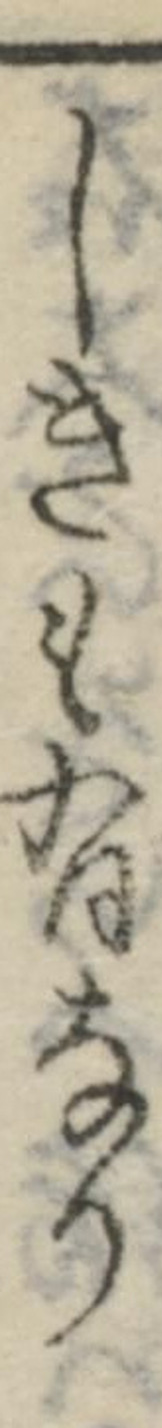しきも有なり
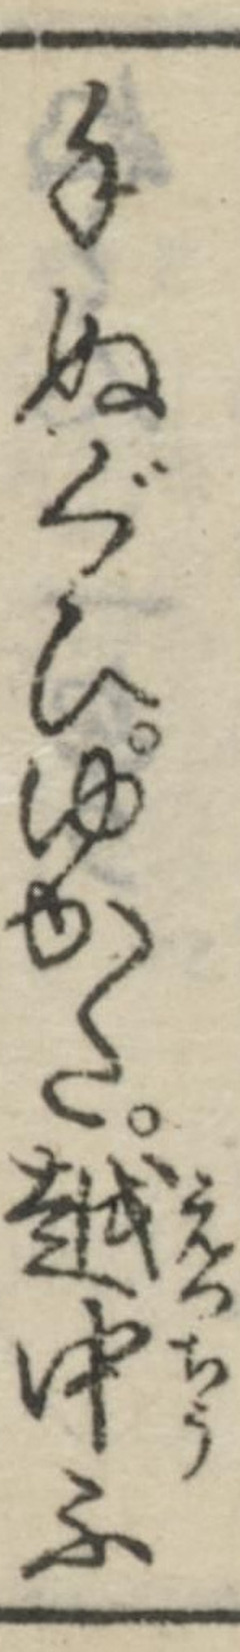手ぬぐい。ゆかた。越中ふ
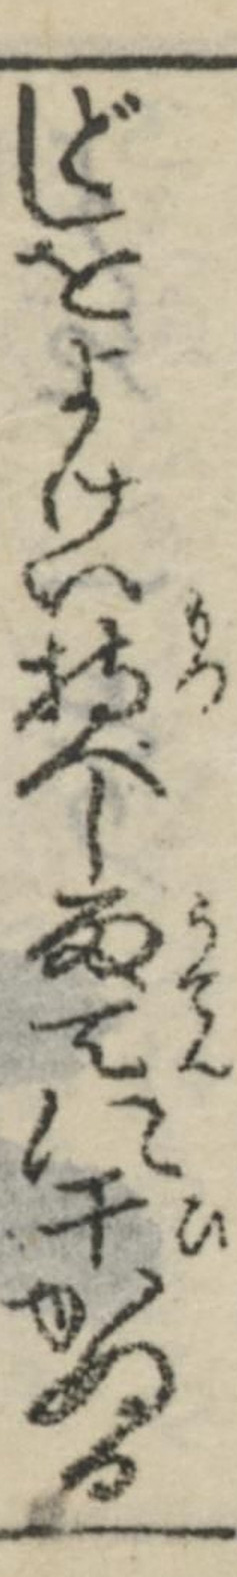どしをよけい持べし雨天に干かぬる
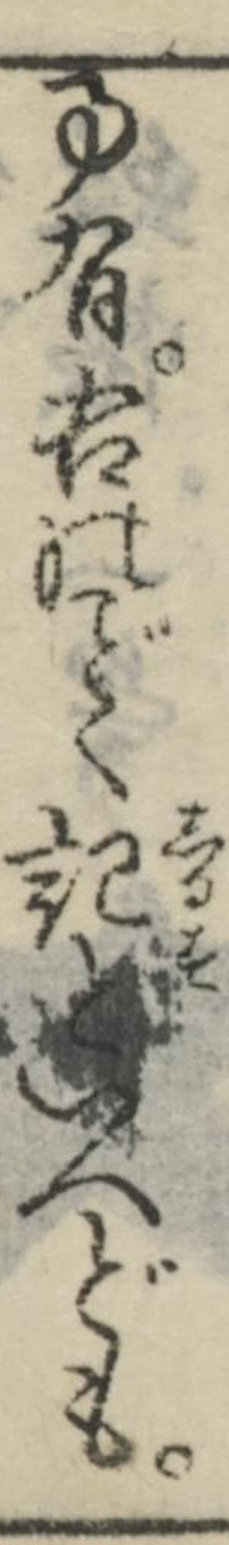事有。右のごとく記といへども。
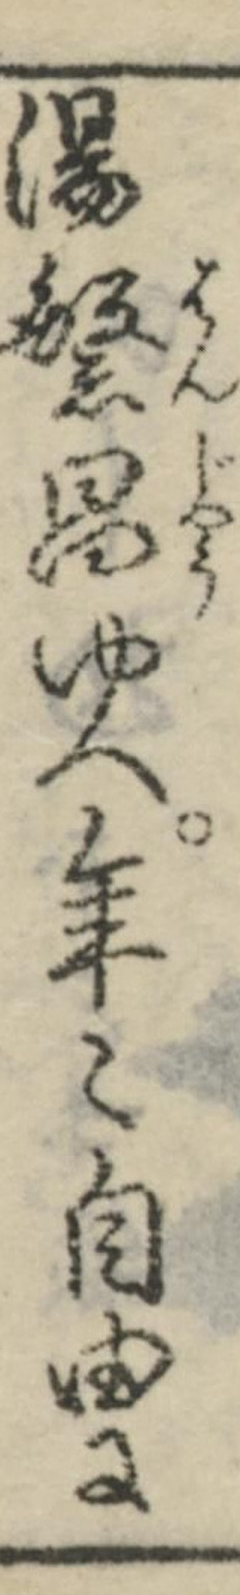湯繁昌ゆえ年々自由に
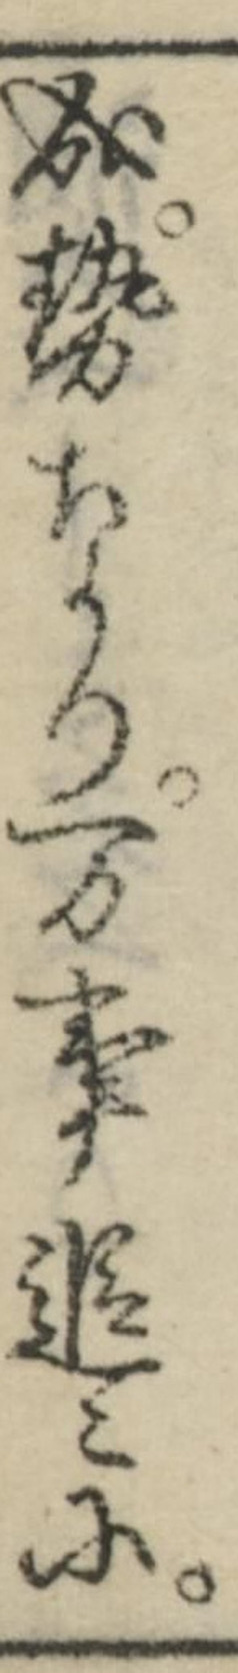成。勢なり。万事追々に。
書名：但州城崎浴湯辧
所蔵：東京大学地震研究所図書室 Earthquake Research Institute Library, The University of Tokyo, JAPAN
